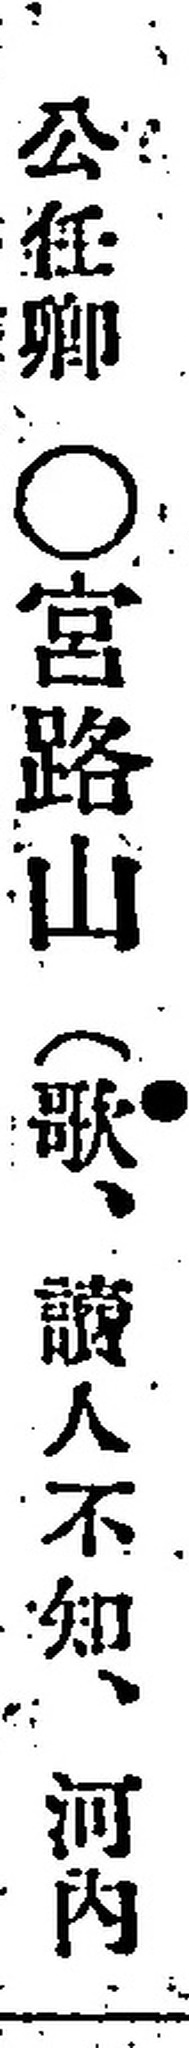公任卿○宮路山(歌、読人不知、河内
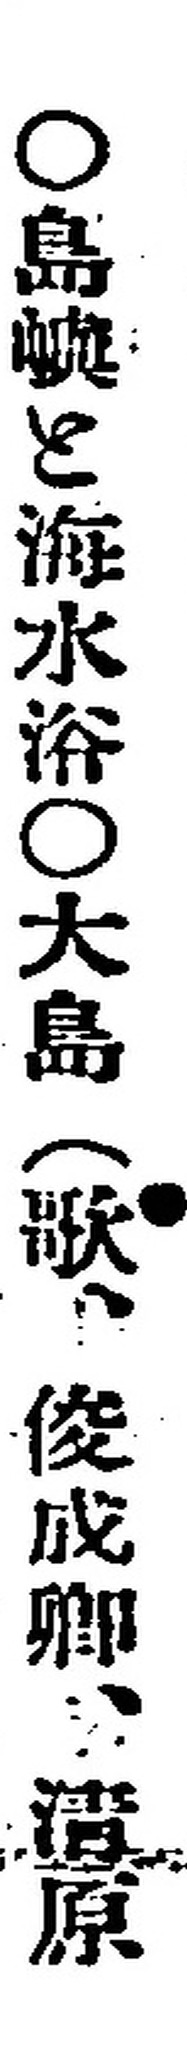○島嶼と海水浴○大島(歌、俊成卿、清原
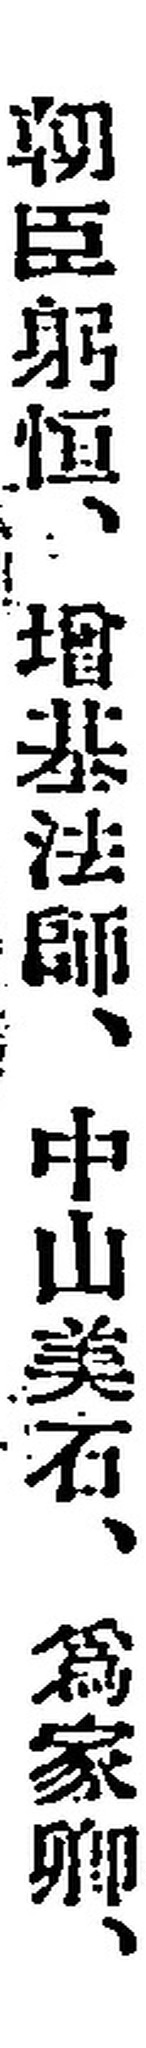朝臣躬恒、増基法師、中山美石、為家卿、
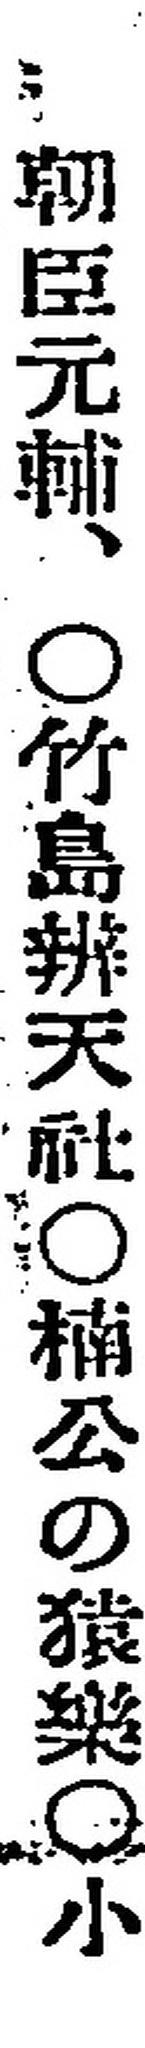朝臣元輔、○竹島弁天社○楠公の猿楽○小
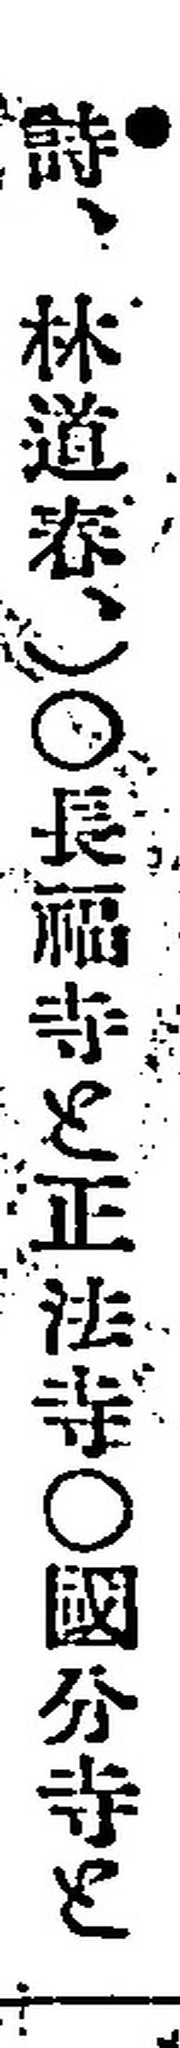詩、林道春、)○長福寺と正法寺○国分寺と
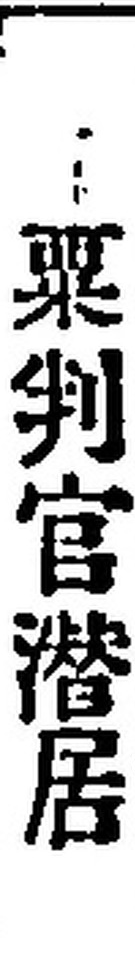粟判官潜居
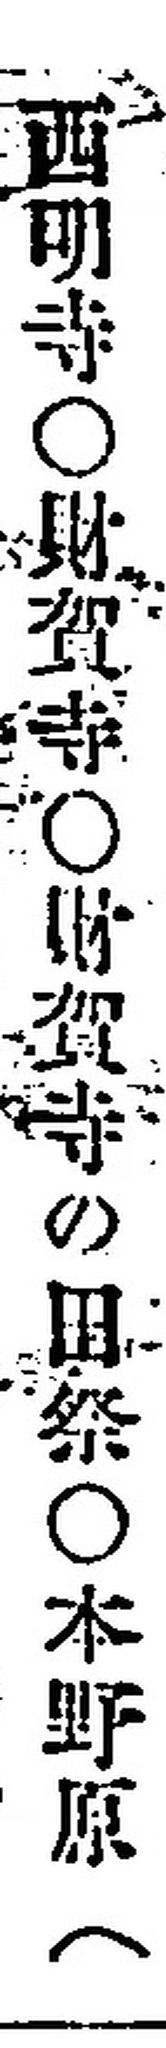西明寺○財賀寺○財賀寺の田祭○本野原(
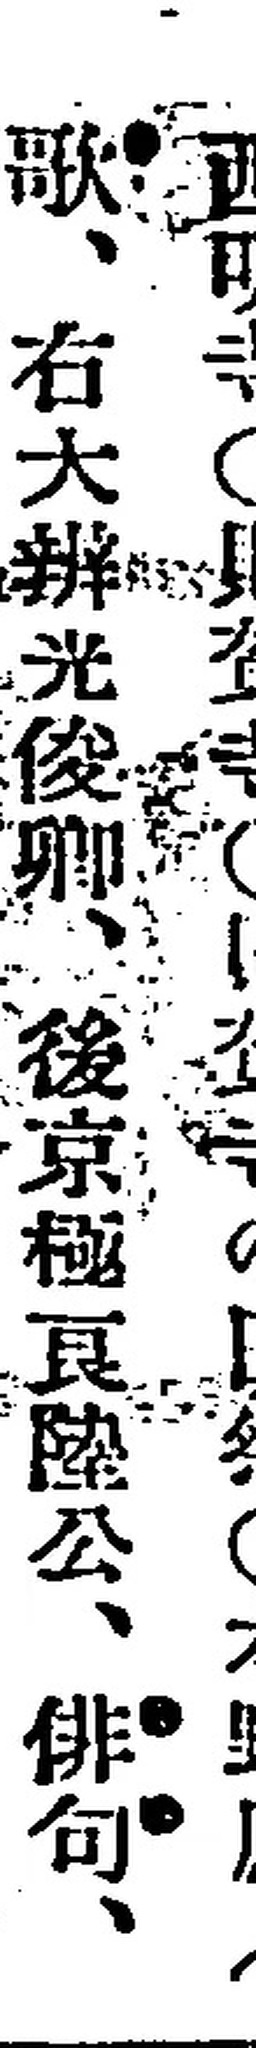歌、右大弁光俊卿、後京極良陸公、俳句、
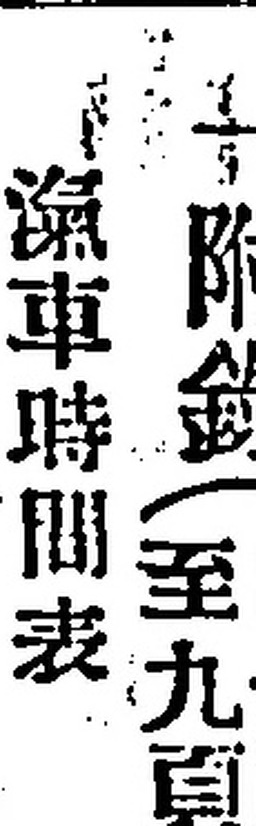汽車時間表
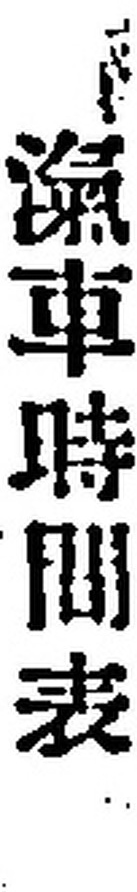汽車時間表
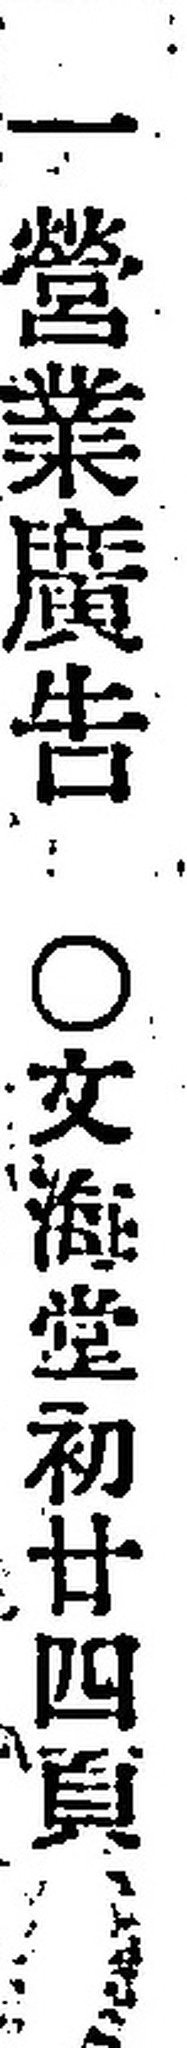一営業広告○文海堂初廿四頁
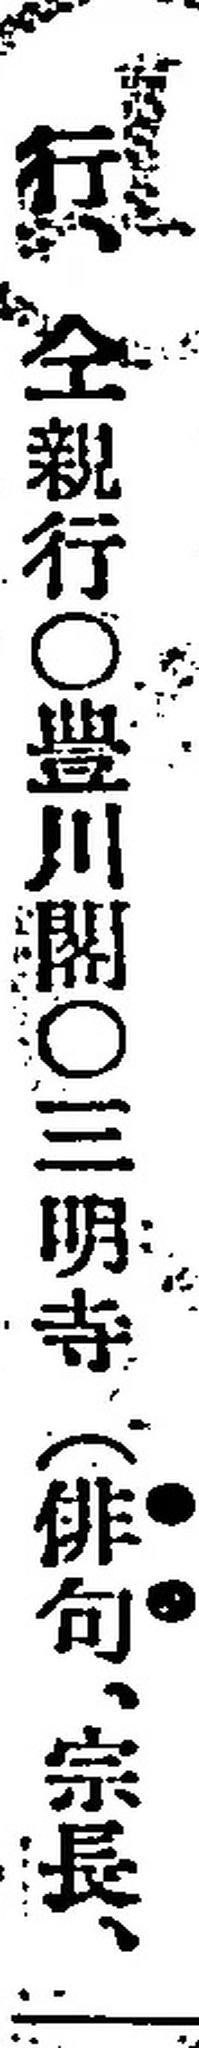行、仝親行○豊川閣○三明寺(俳句、宗長、
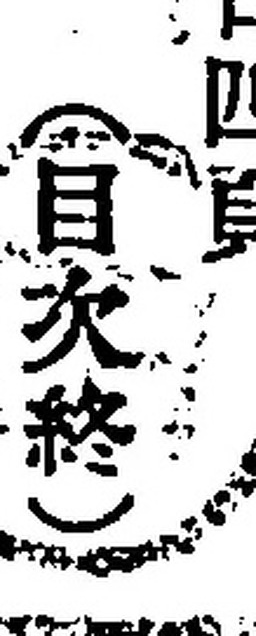(目次終)

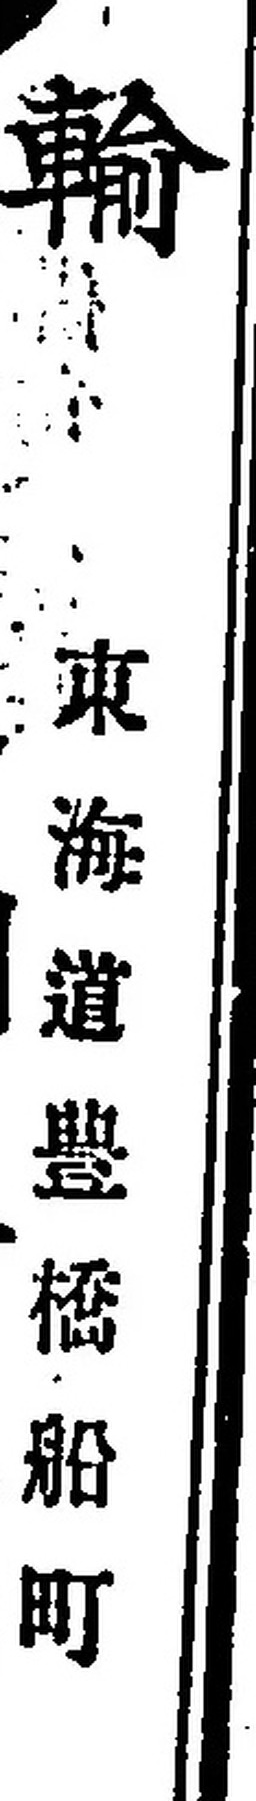東海道豊橋船町
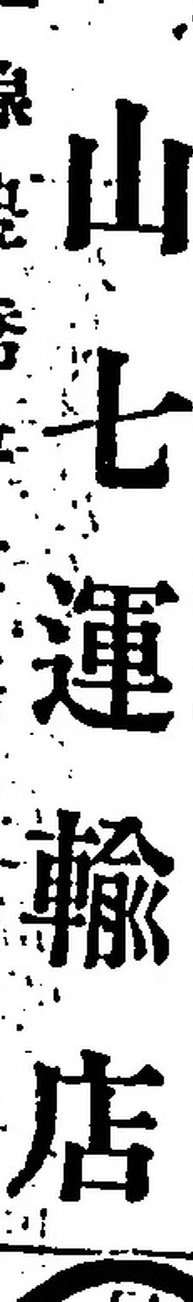山七運輸店
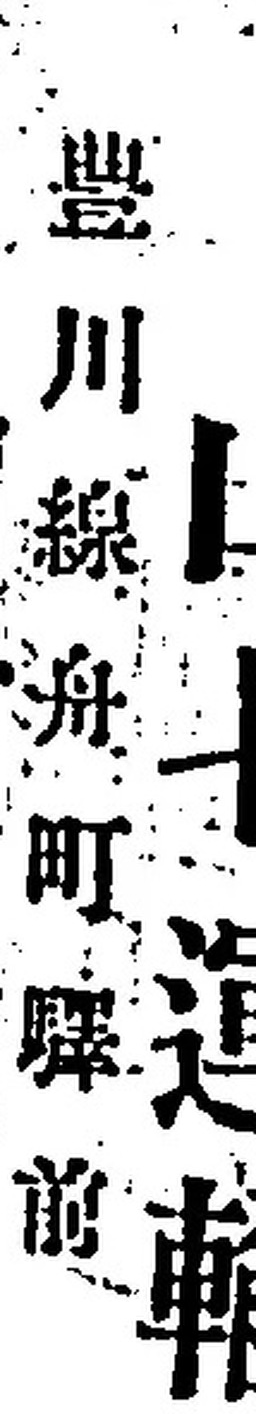豊川線舟町駅前
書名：東参名勝案内
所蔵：国立国会図書館 National Diet Library, JAPAN
